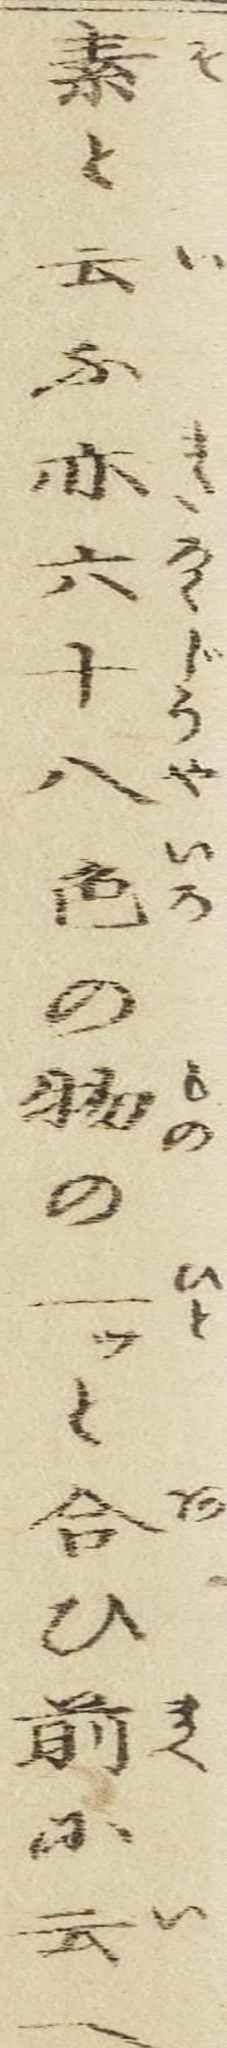素と云ふ亦六十八色の物の一つと合ひ前に云へ
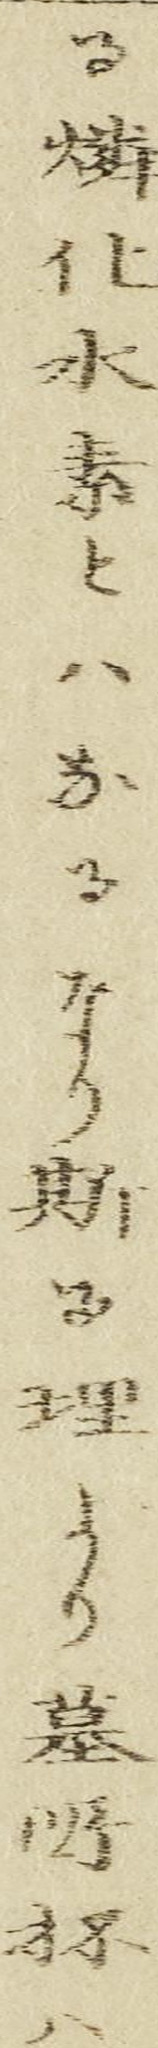る燐化水素とはなるなり斯る理より墓所抔は
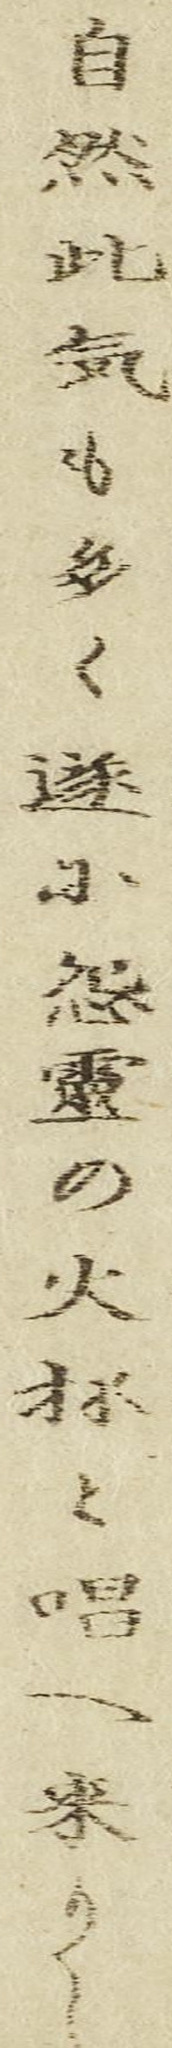自然此気も多く遂に怨霊の火抔と唱へ来りし
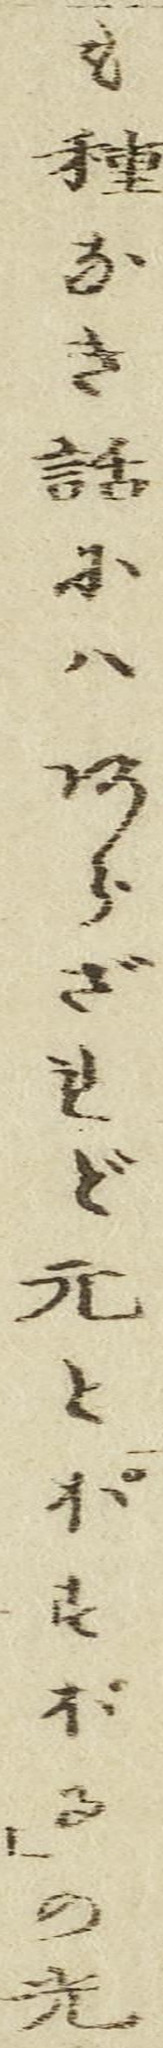も種なき話にはあらざれど元と「ぽすぽる」の光
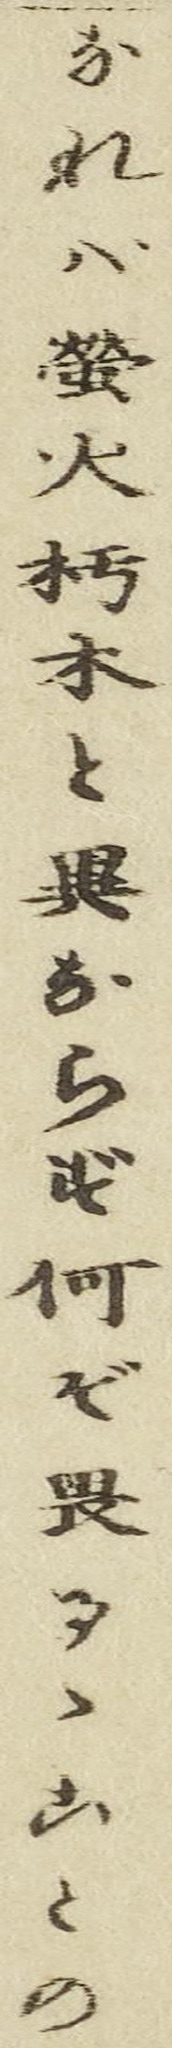なれば蛍火朽木と異ならず何ぞ畏るゝことの
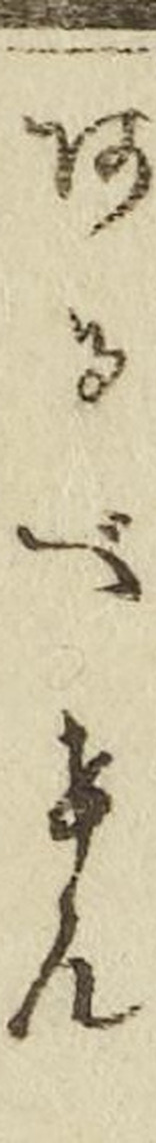あるべけん
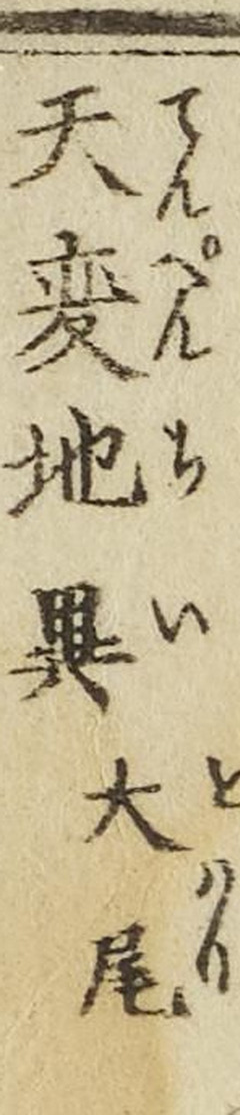天変地異大尾
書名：天変地異
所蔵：東京大学地震研究所図書室 Earthquake Research Institute Library, The University of Tokyo, JAPAN
